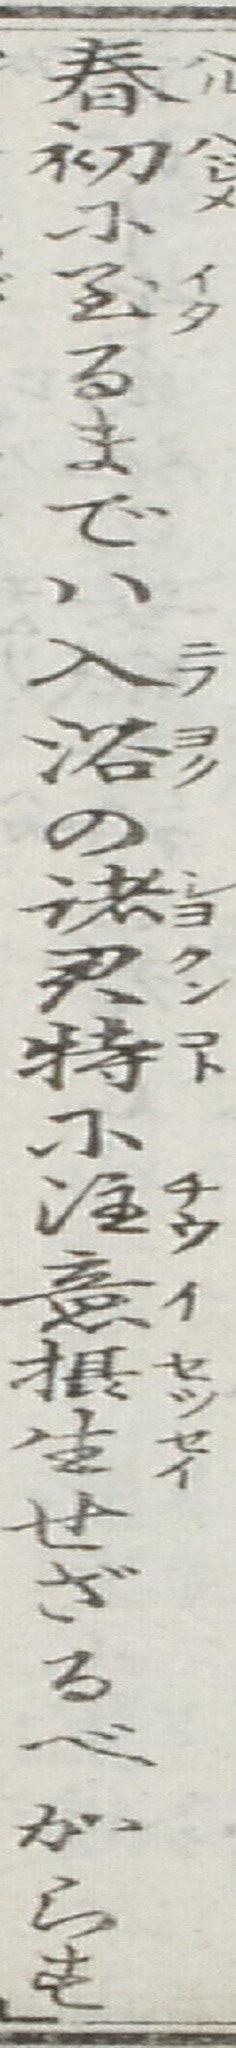春初に至るまでは入浴の諸君特に注意摂生せざるべがらす」
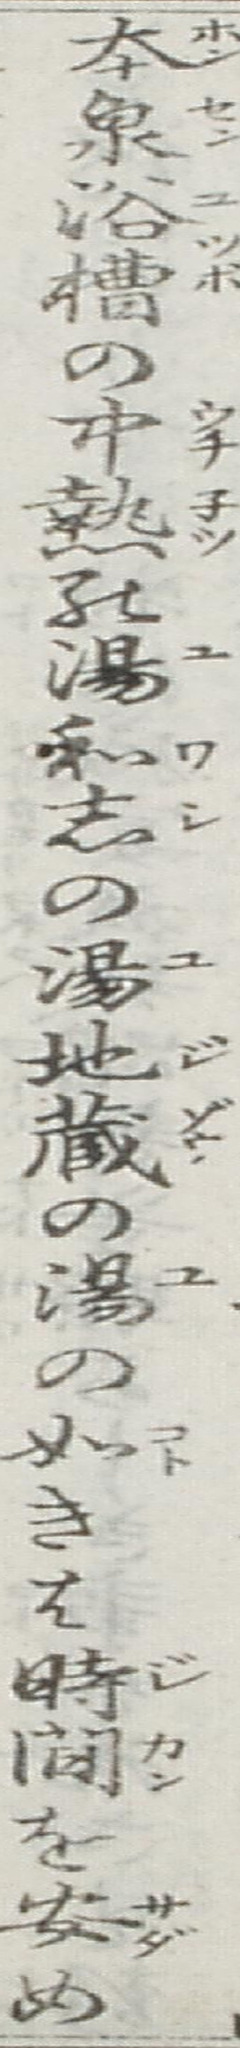本泉浴槽の中熱孔湯和志の湯地蔵の湯の如きは時間を安
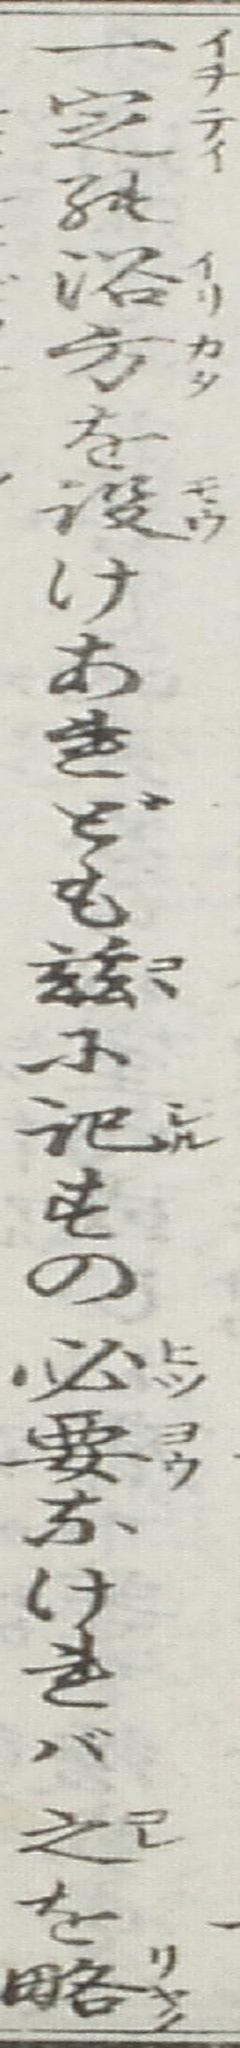一定の浴方を設けあれども茲に記すの必要にければ之を略
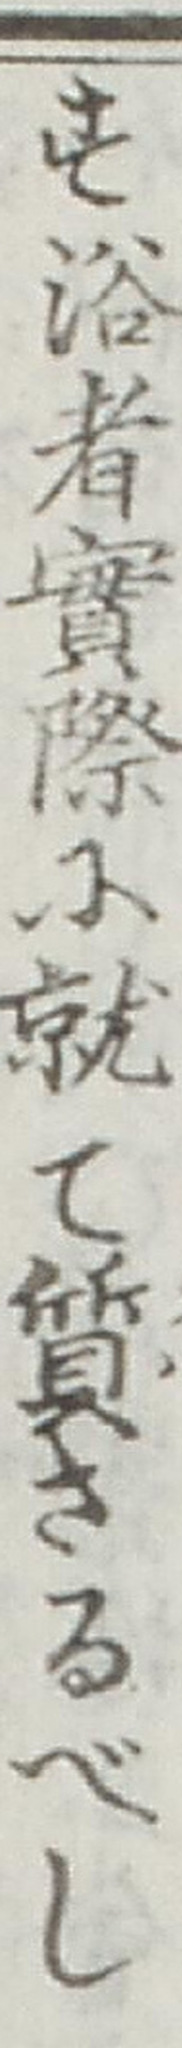す浴者実際に就て質さるべし
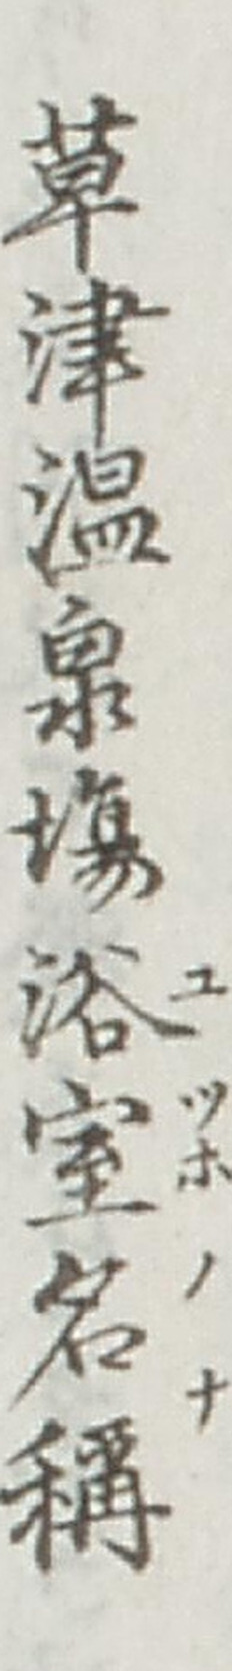草津温泉場浴室名称

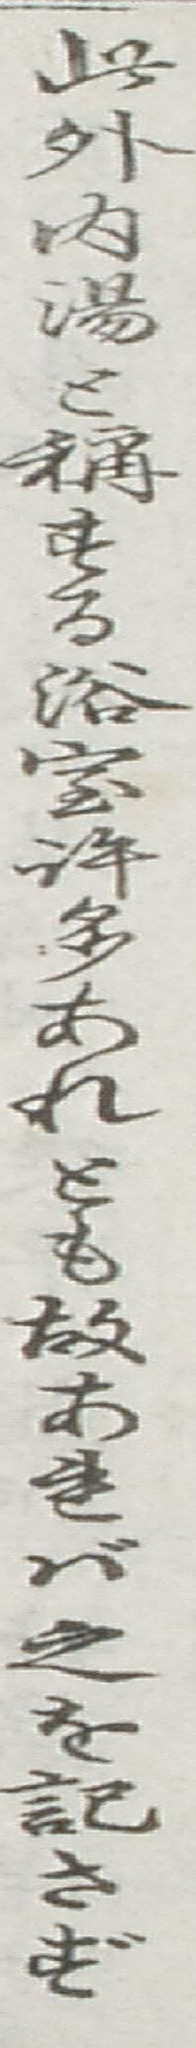此外内湯と称する浴室許多あれとも故あれば之を記さず
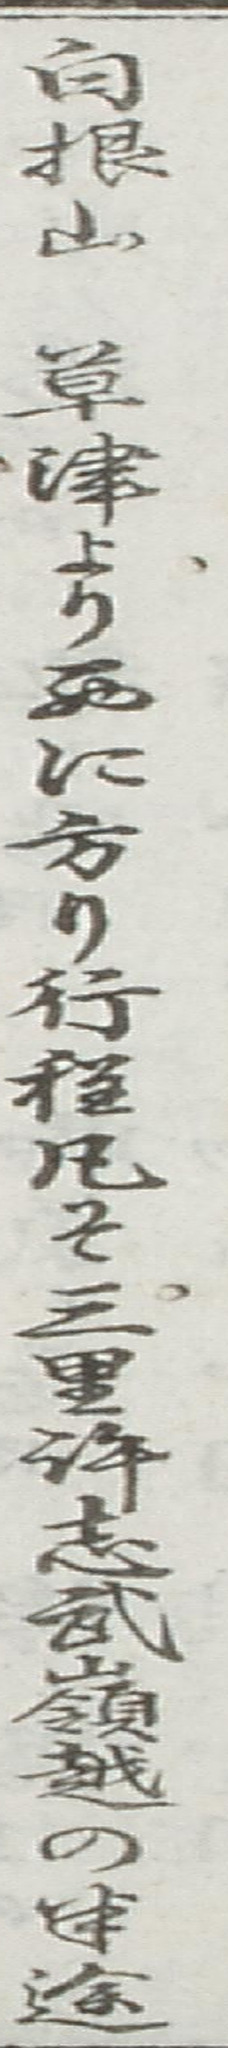白根山草津より西に方り行程凡そ三里許志武嶺越の中途
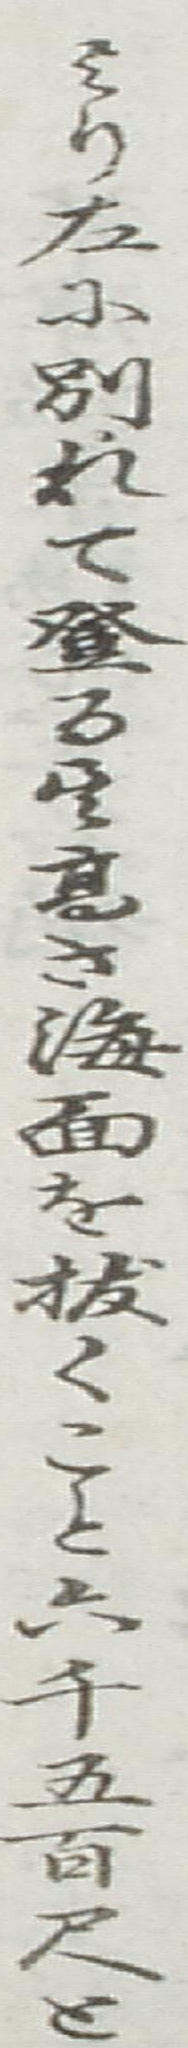より左に別れて登る其高さ海面を抜くこと六千五百尺と
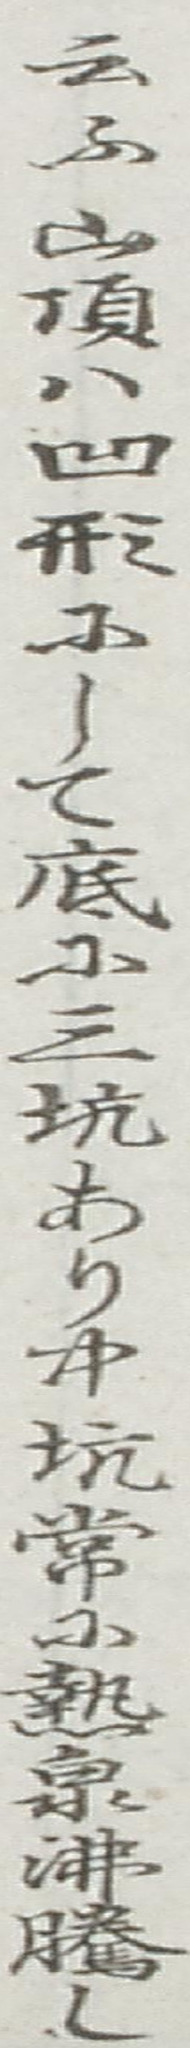云ふ山頂は凹形にして底に三坑あり中抗常に熱泉沸騰し
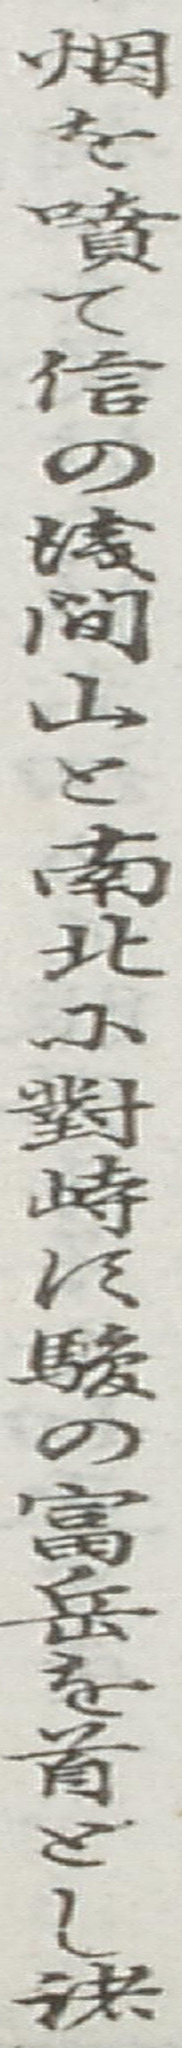烟を噴いて信の浅間山と南北に対峙す駿の富岳を首とし諸
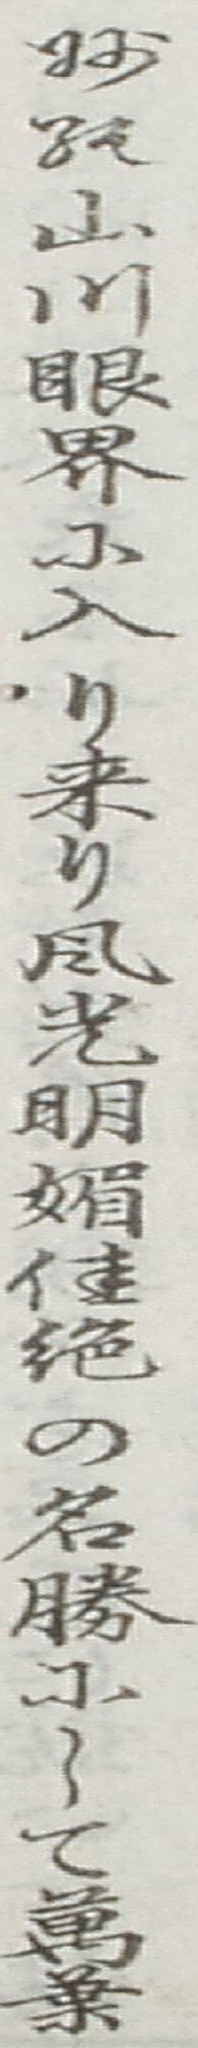州の山川眼界に入り来り風光明媚佳絶の名勝にして万葉
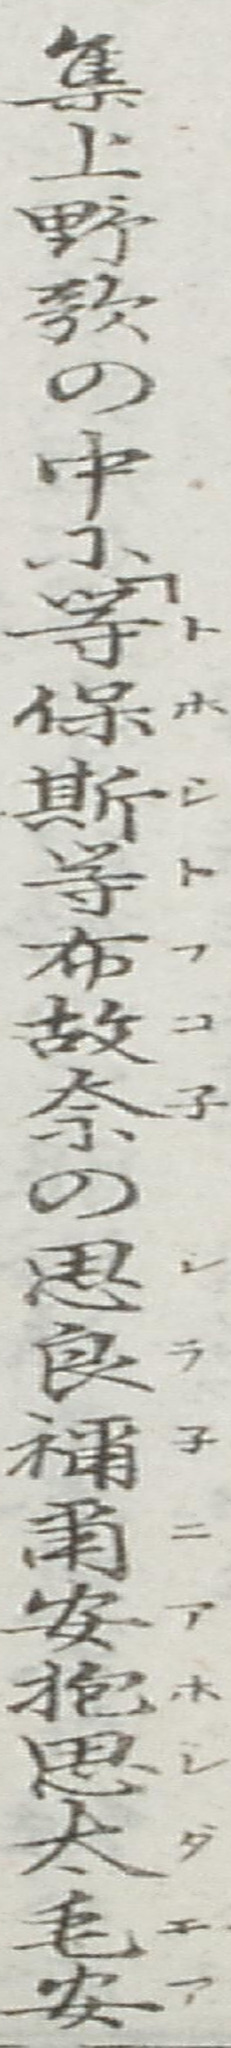集上野歌の中に「等保斯等布故奈の思良禰爾安抱思太毛安
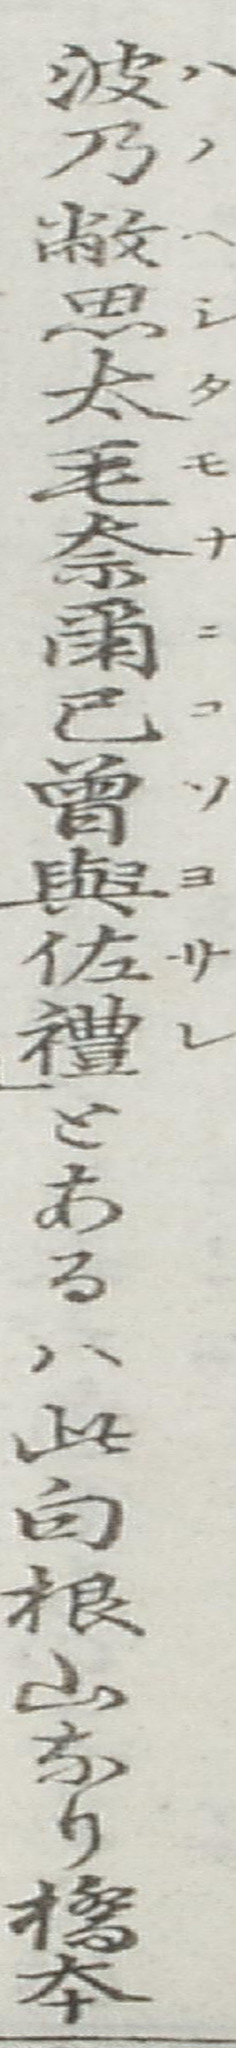波乃敝思太毛奈爾己曾与佐礼」とあるは此白根山なり橋本
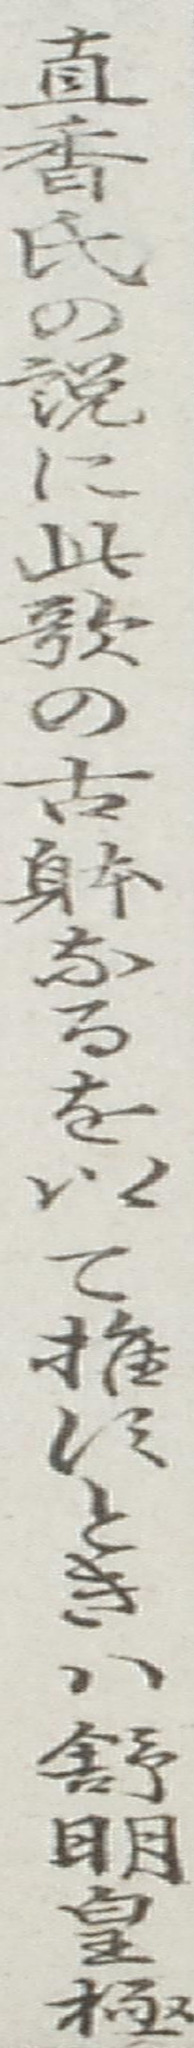真香氏の説に此歌の古体なるを以て推すときは舒明皇極
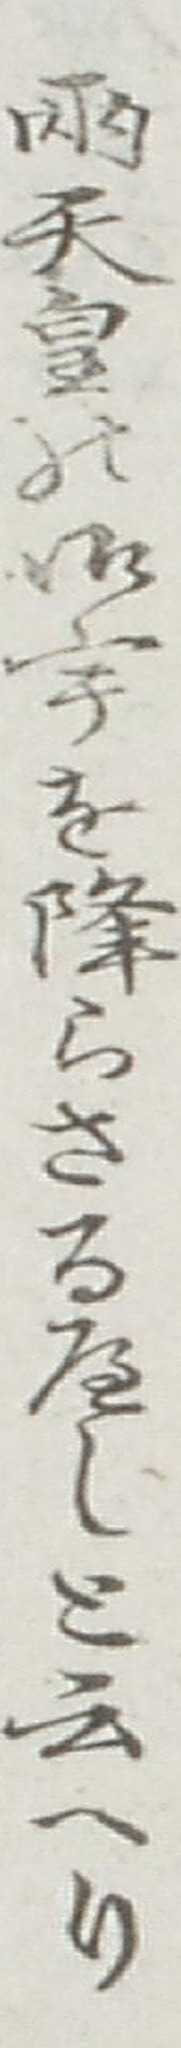両天皇の御宇を降らさるへしと云へり
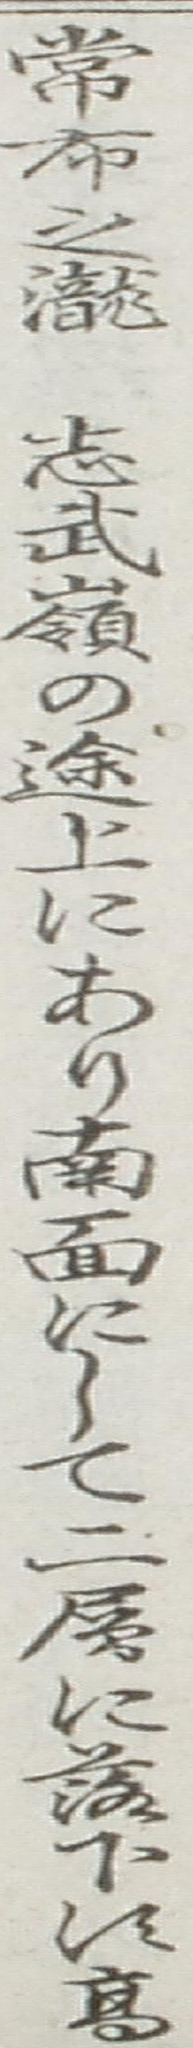常布之瀧志武嶺の途上にあり南面にして二層に落下す高
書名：草津温泉誌　全
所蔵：東京大学地震研究所図書室 Earthquake Research Institute Library, The University of Tokyo, JAPAN
